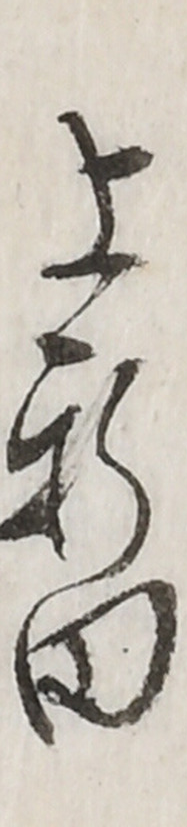上新田
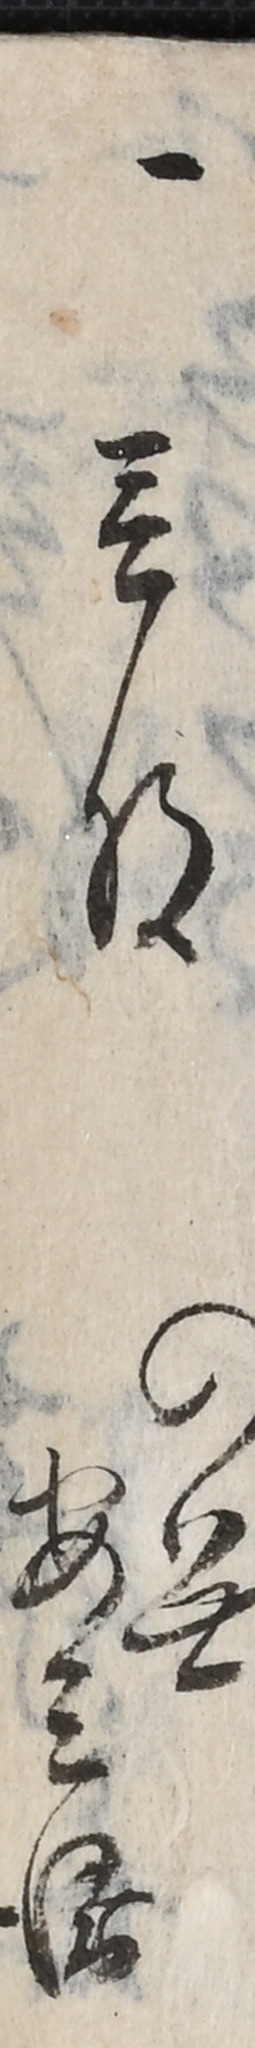一壱枚孫兵衛

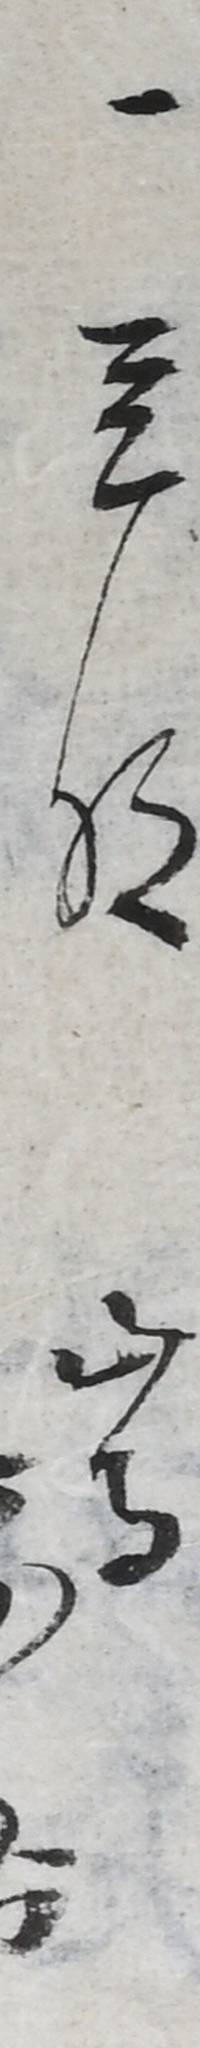一壱枚熊介
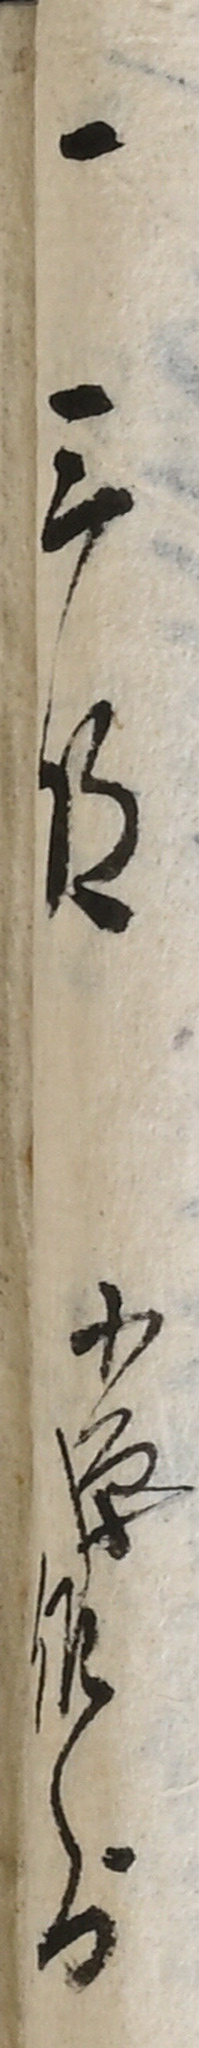一弐枚源左衛門
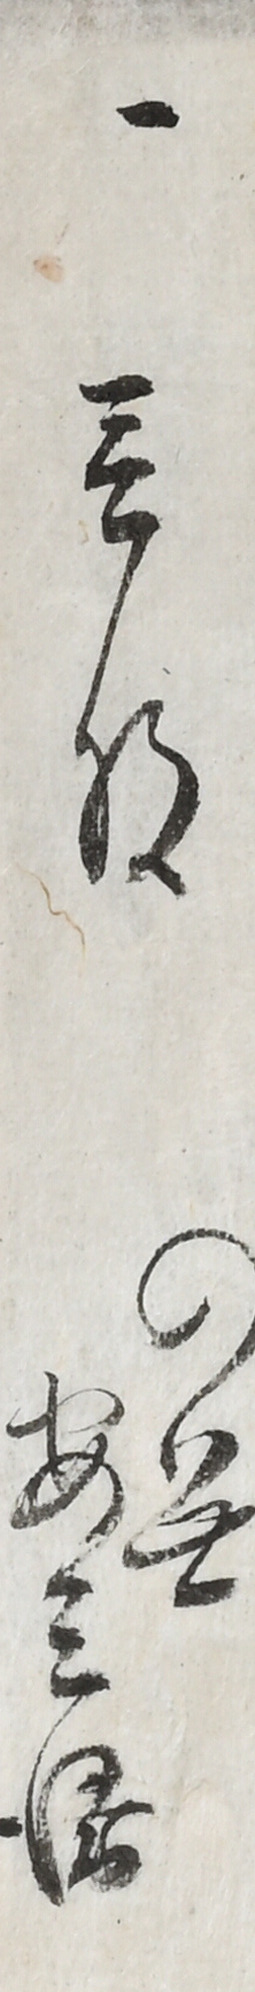一壱枚安兵衛
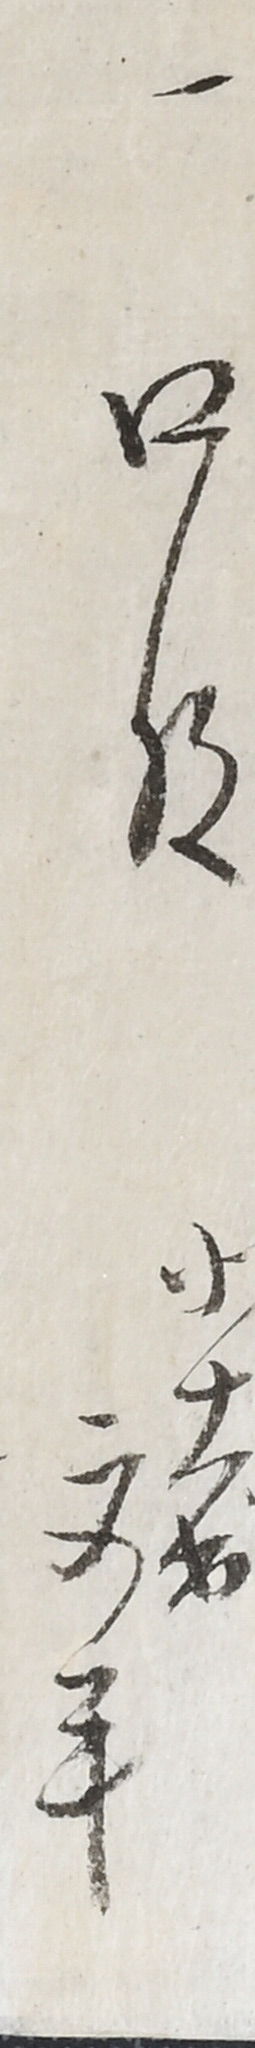一四枚文平
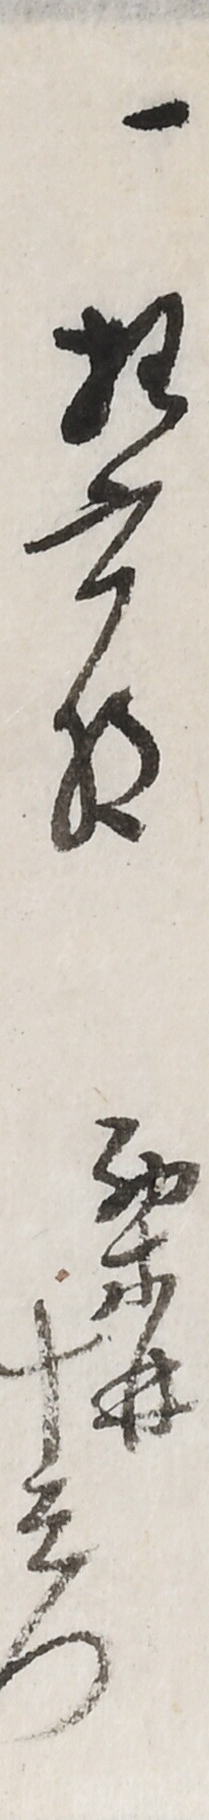一拾四枚定右衛門
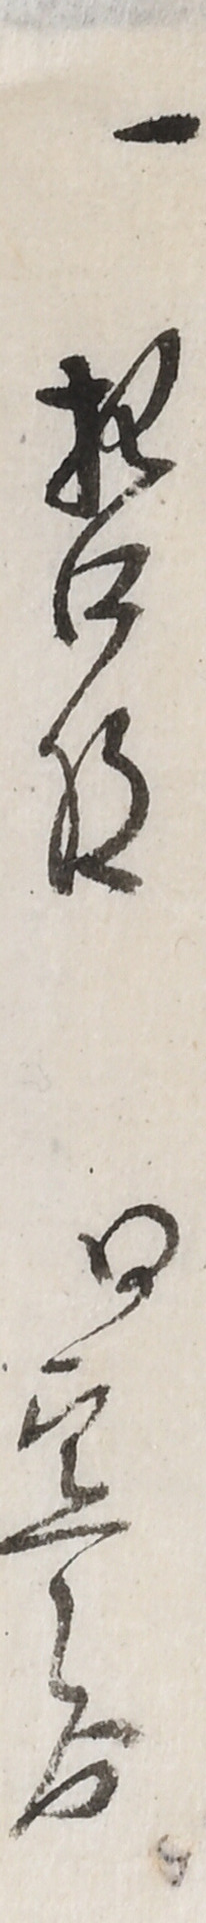一拾四枚定右衛門
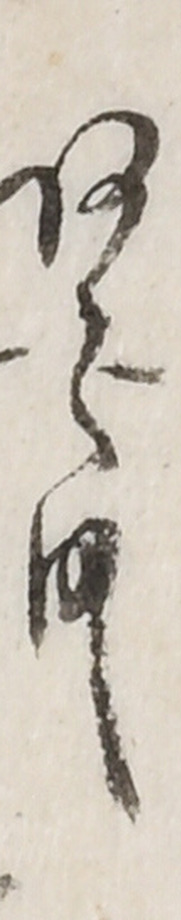あら町
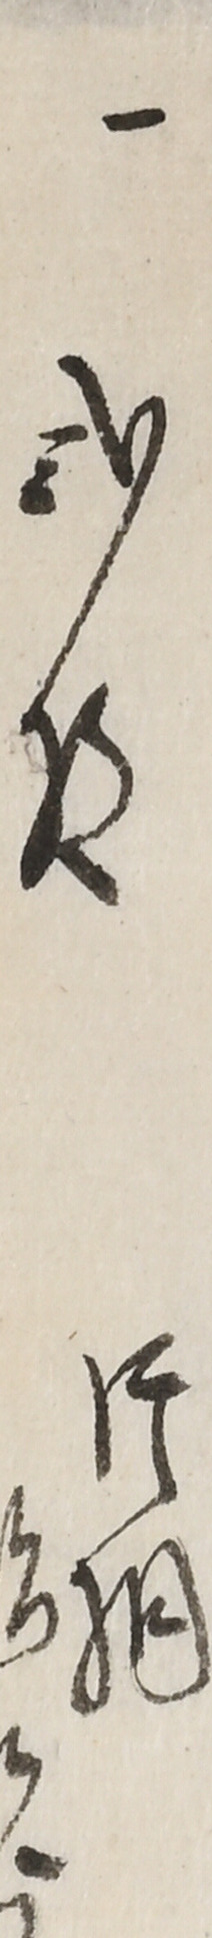一弐枚宇吉
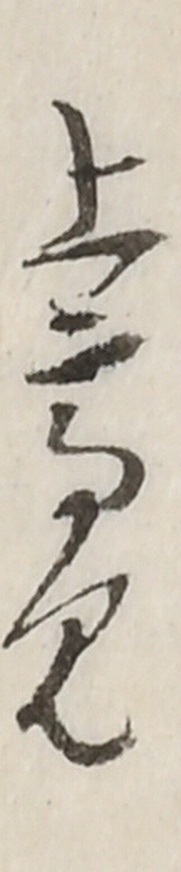上高見
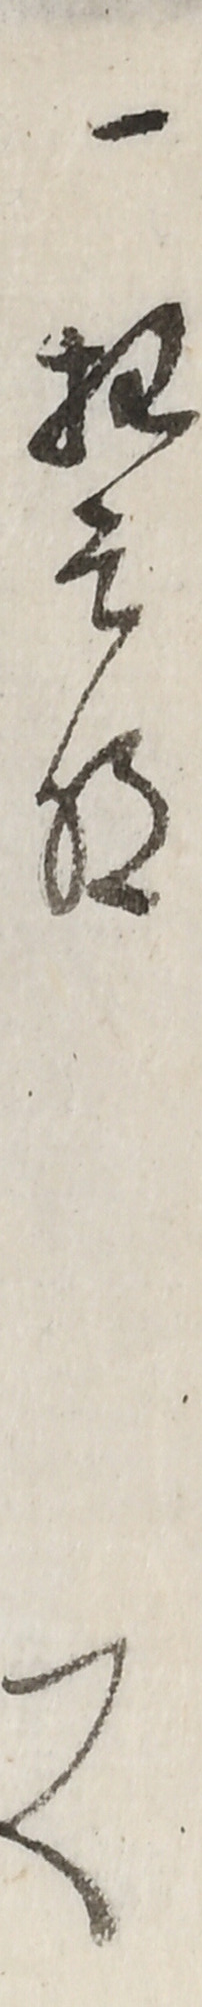一拾壱枚同人
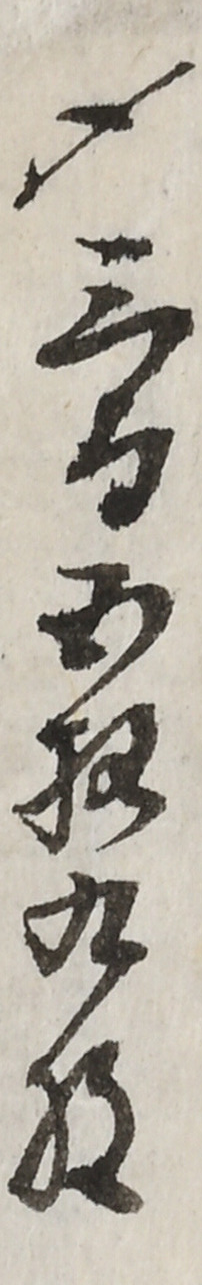〆三百五拾九枚

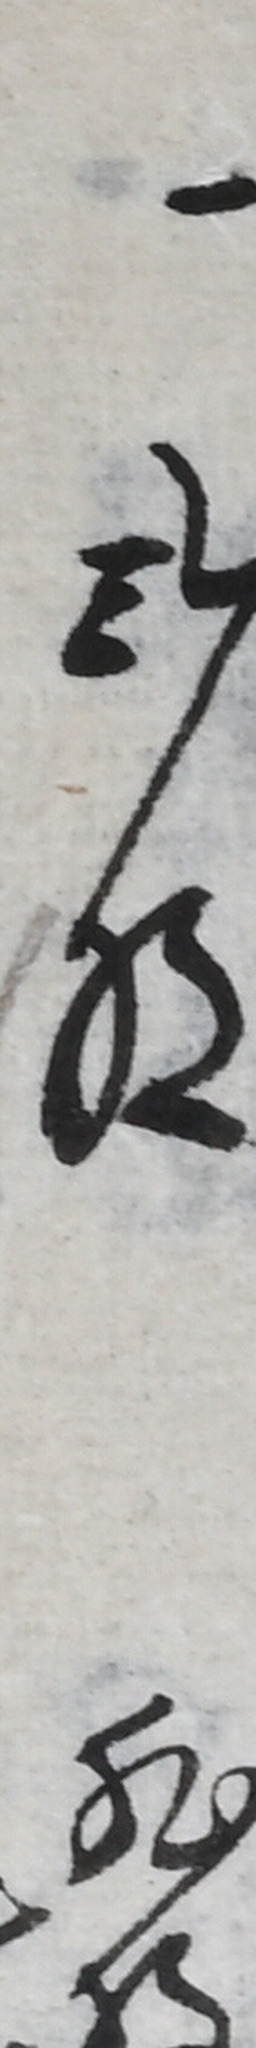一弐枚在人
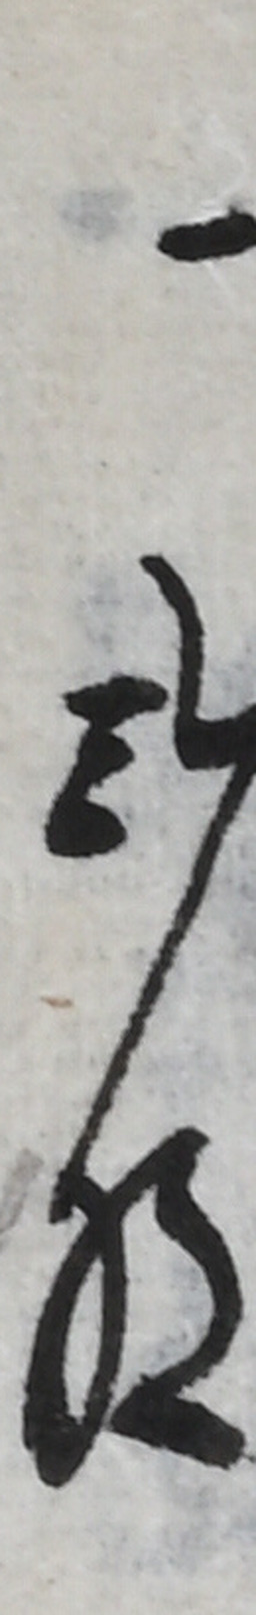一三枚
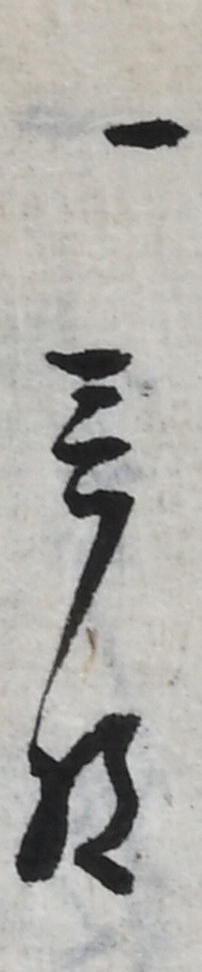一三枚
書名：髙遠限楮幣引換覚帳
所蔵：伊那市立高遠町図書館・合同会社AMANE
